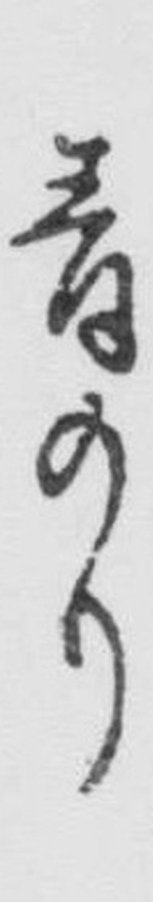青のり
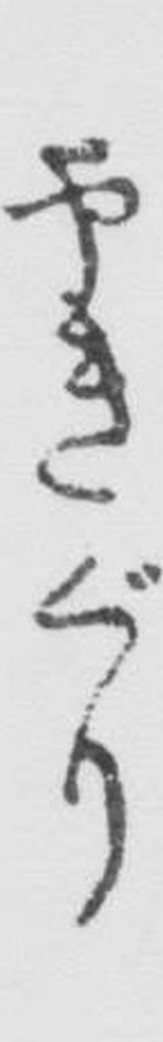やきぐり
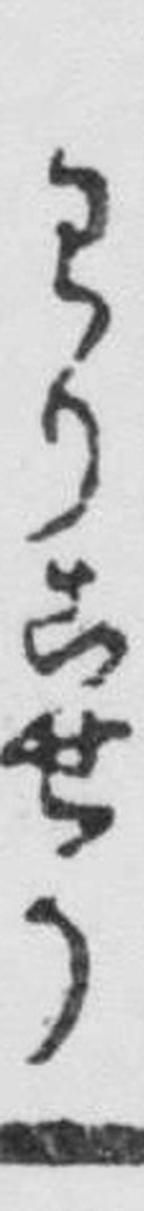わりこせう
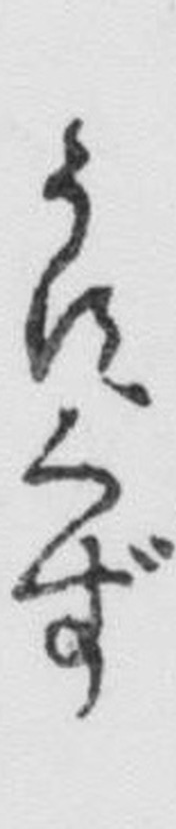うすくず
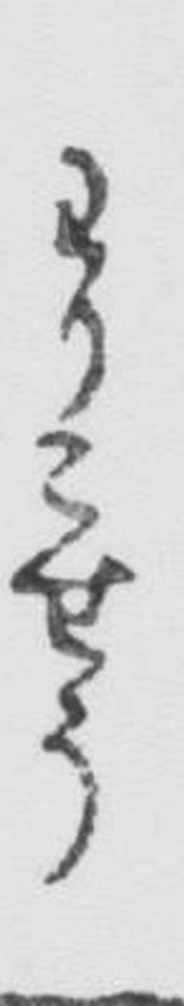わりこせう
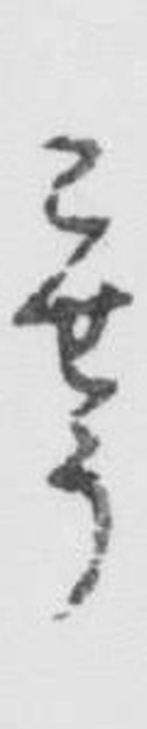こせう
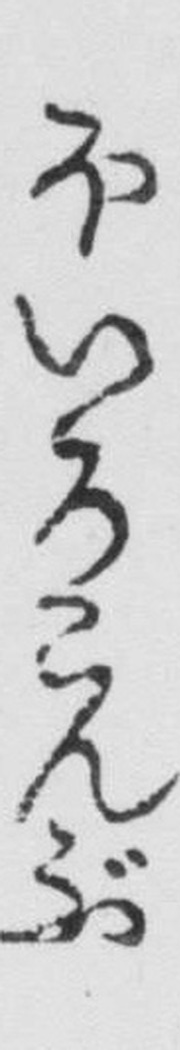ほいろこんぶ
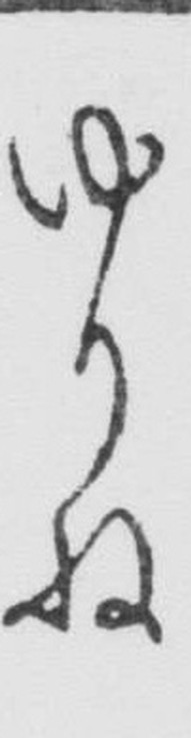ゆりね
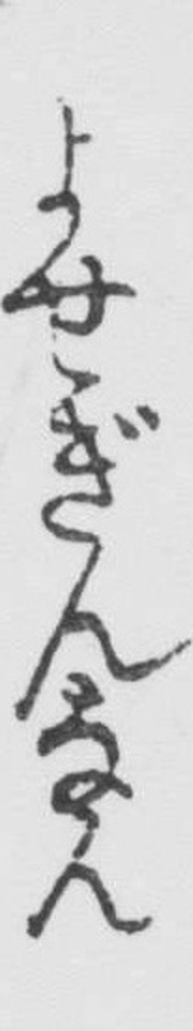よせぎんなん
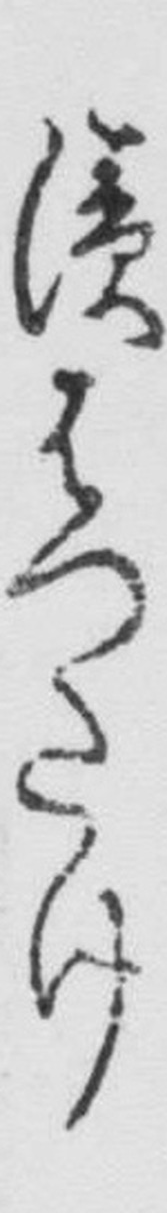漬はつたけ
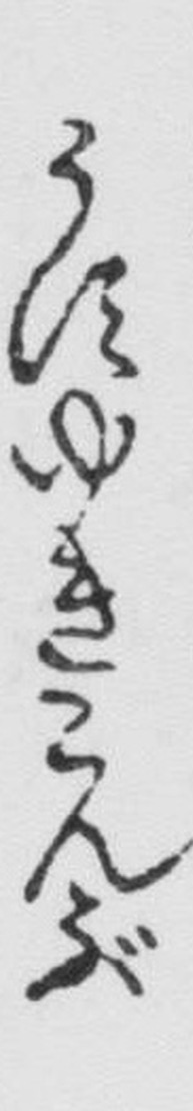うすゆきこんぶ
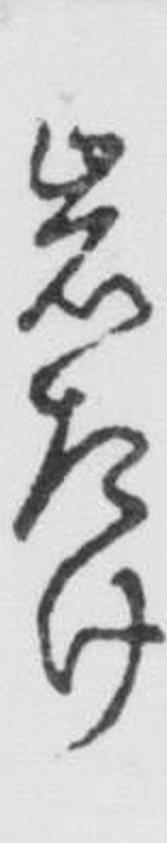岩たけ
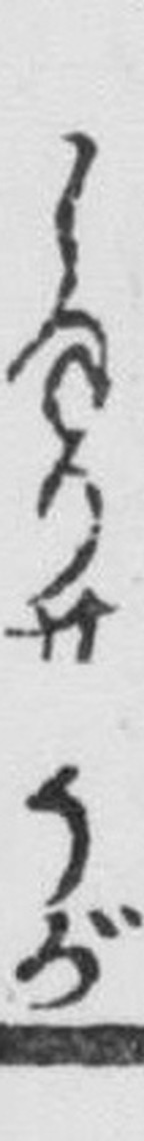しほりせうが
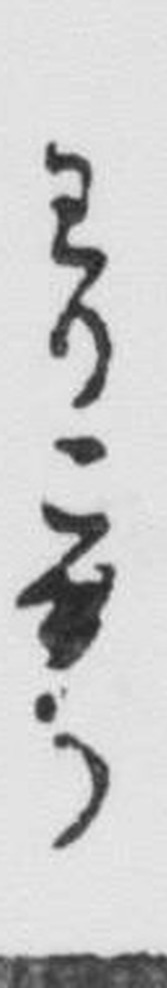わりこせう
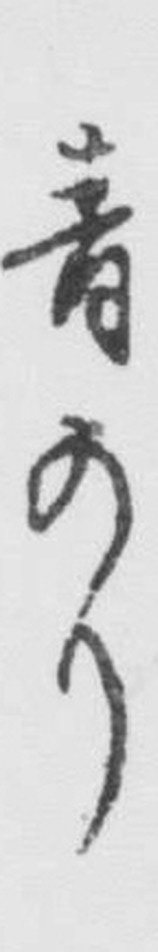青のり
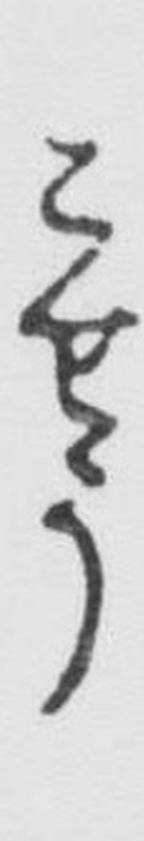こせう
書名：諸家通用/即席料理
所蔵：大阪府立大学学術情報センター 国文学研究資料館
